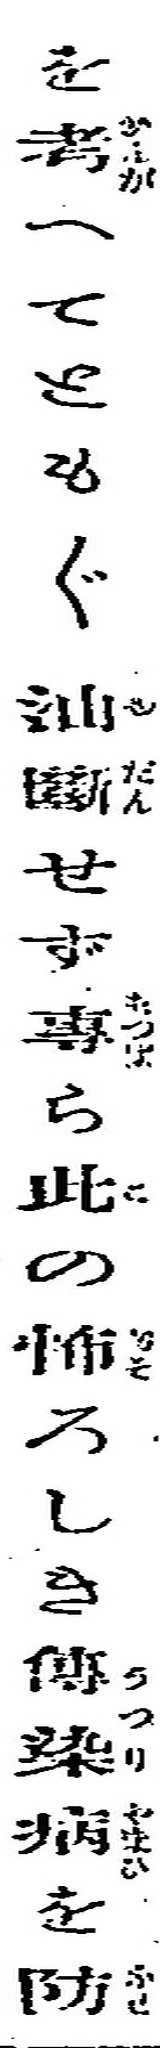を考へてとも〴〵油斷せず専ら此の怖ろしき傅染病を防
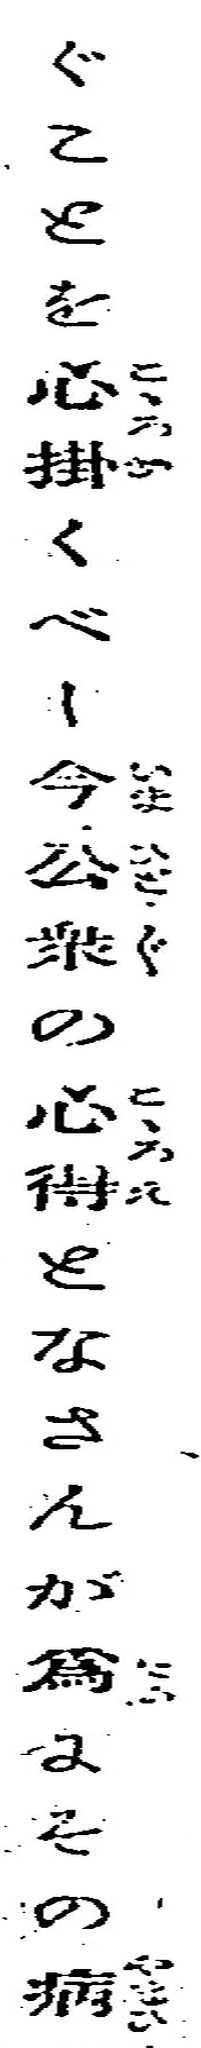ぐことを心掛くべし今公衆の心得となさんが為にその病
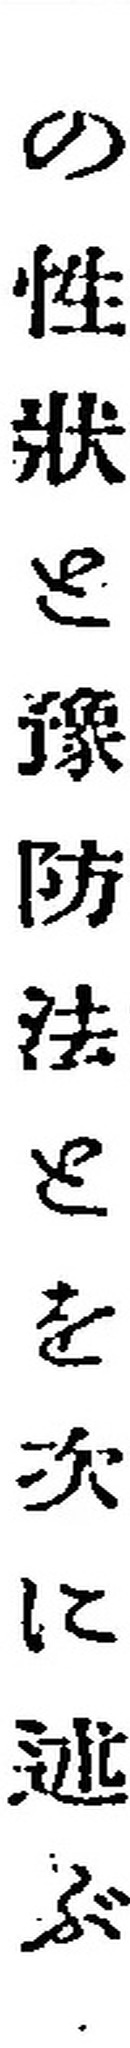の性状と豫防法とを次に述
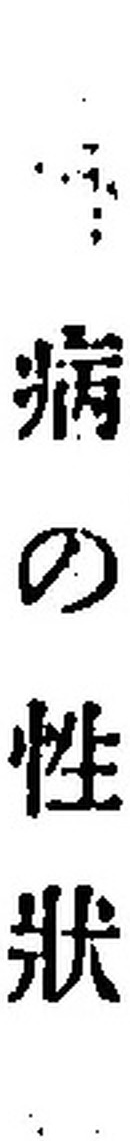病の性状
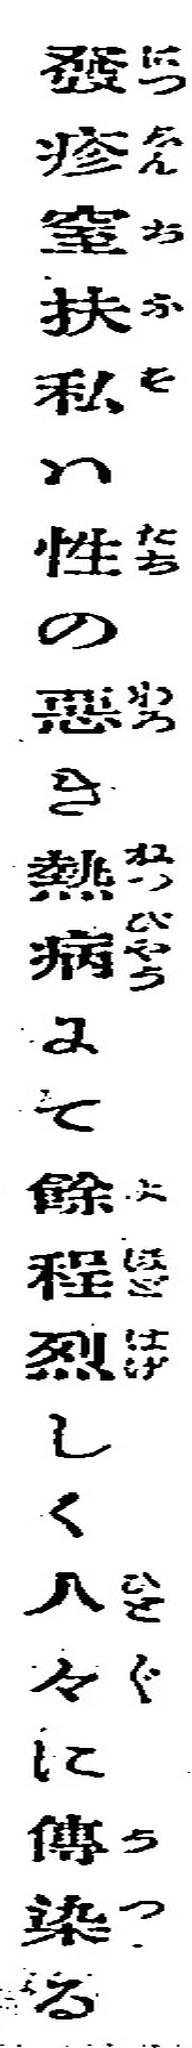発疹窒扶私は性の惡き熱病にて餘程烈しく人々に傳染る
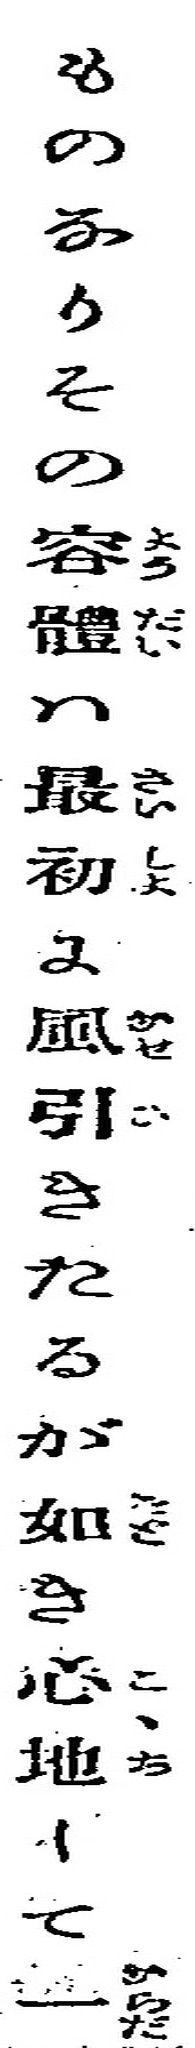ものなりその容體は最初に風引きたるが如き心地して一
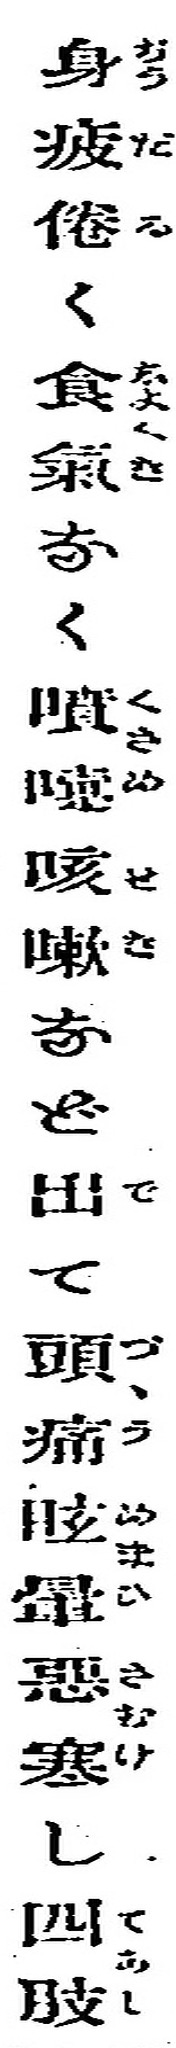身披倦く食氣なく噴嚔咳嗽など出て頭痛眩暈惡寒し四肢
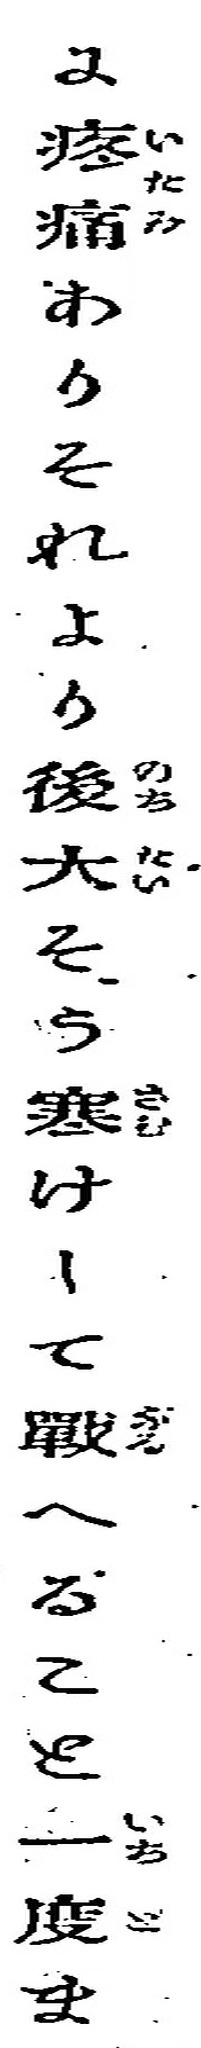に疼痛ありそれより後大そう寒けして戰へること一度ま
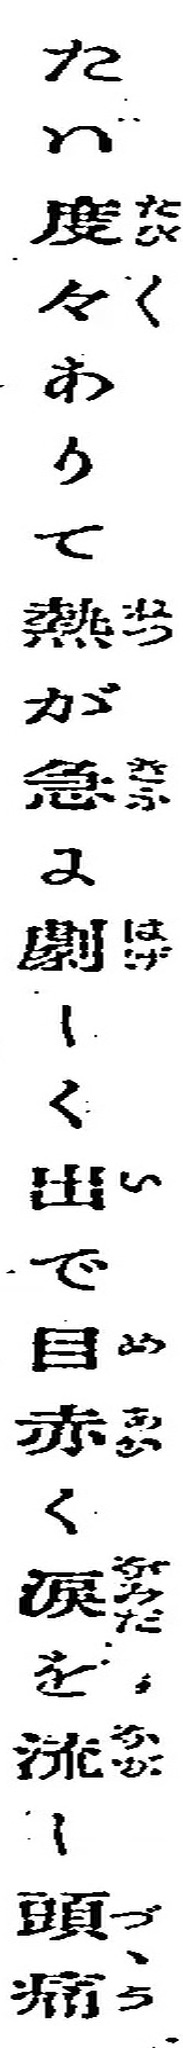たは度々ありて熱が急に劇しく出で目赤く涙を流し頭痛
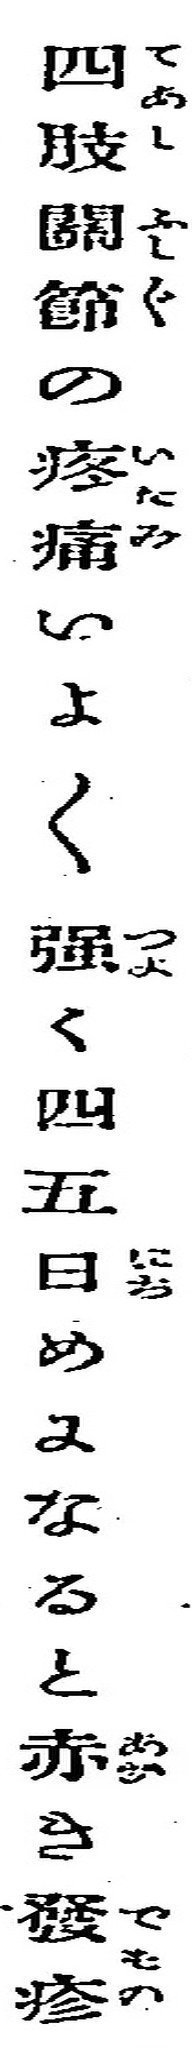四肢關節の疼痛いよ〳〵強く四五日めになると赤き發疹
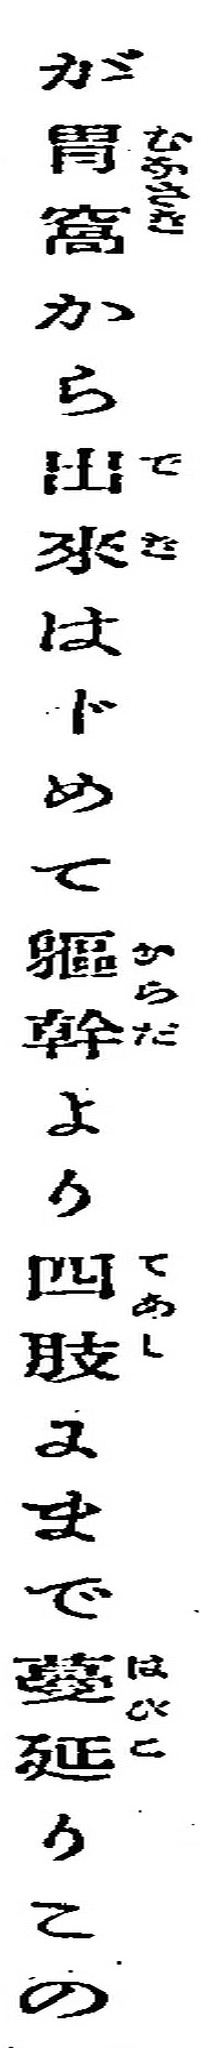が胃窩から出來はじめて軀幹より四肢にまで蔓延りこの
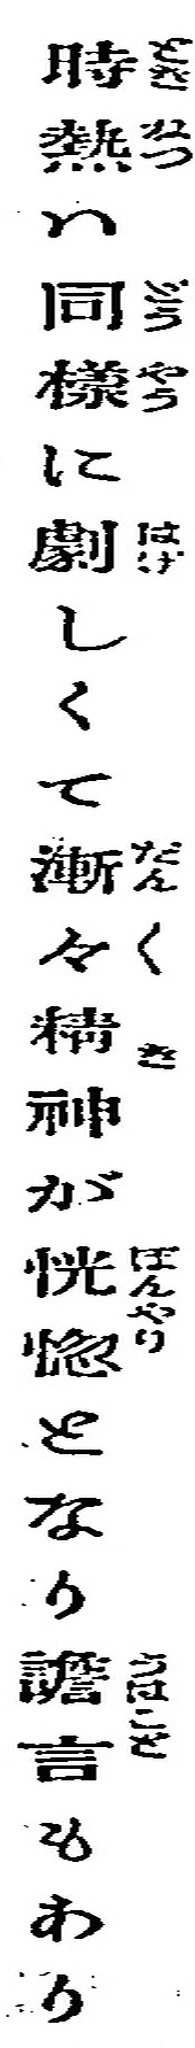時熱は同様に劇しくて漸々精神が恍惚となり譫言もあり
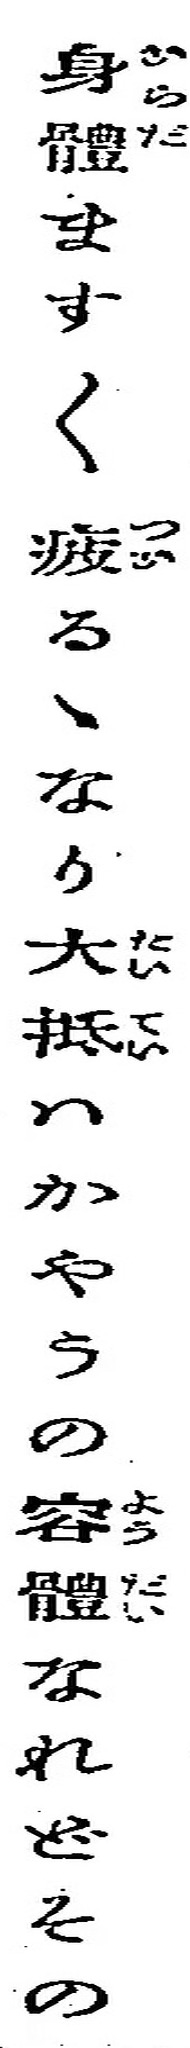身體ます〳〵疲るゝなり大抵はかやうの容體なれどその
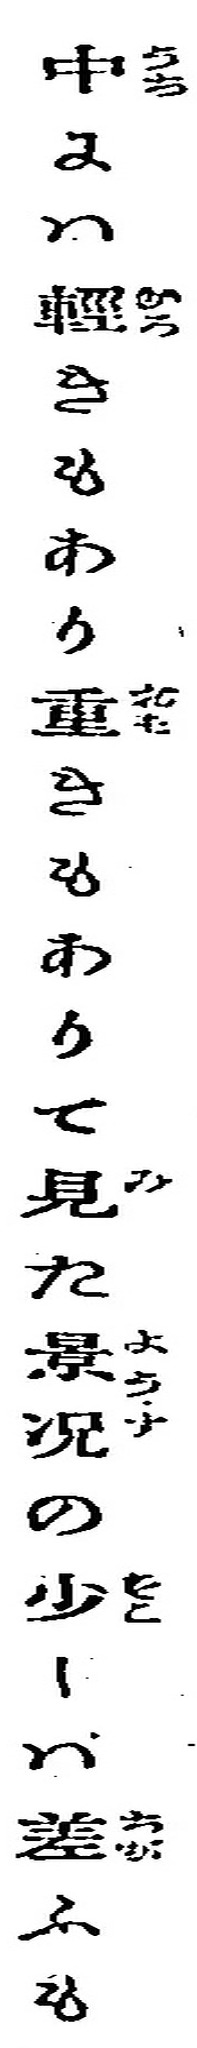中には軽きもあり重きもありて見た景況の少しは差ふも
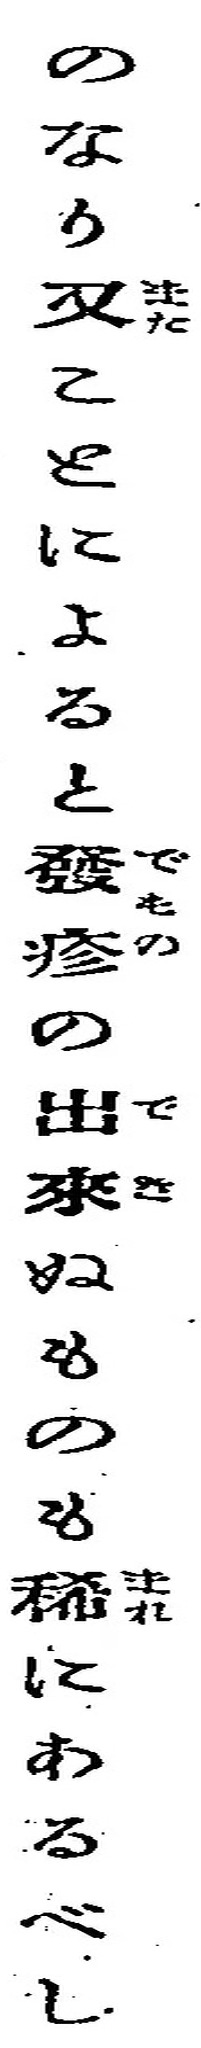のなり又ことによると發疹の出來ぬものも稀にあるべし

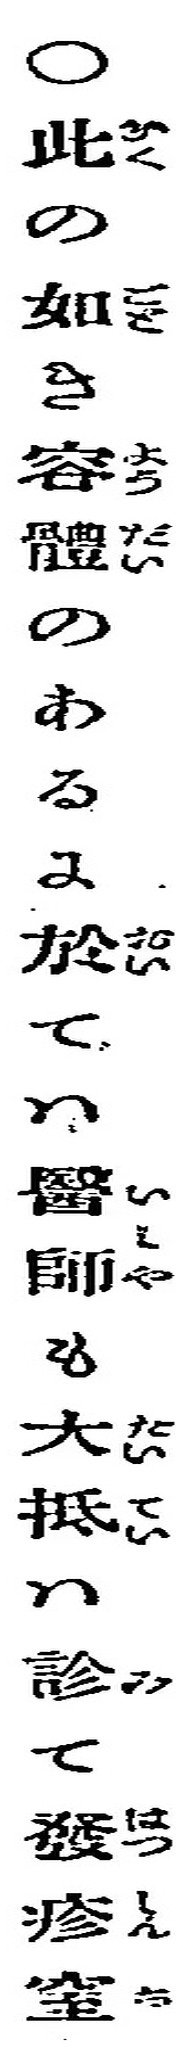〇此の如き容體のあるに於ては醫師も大抵は診て発疹窒
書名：発疹窒扶私予防の訓
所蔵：国立国会図書館 National Diet Library, JAPAN
